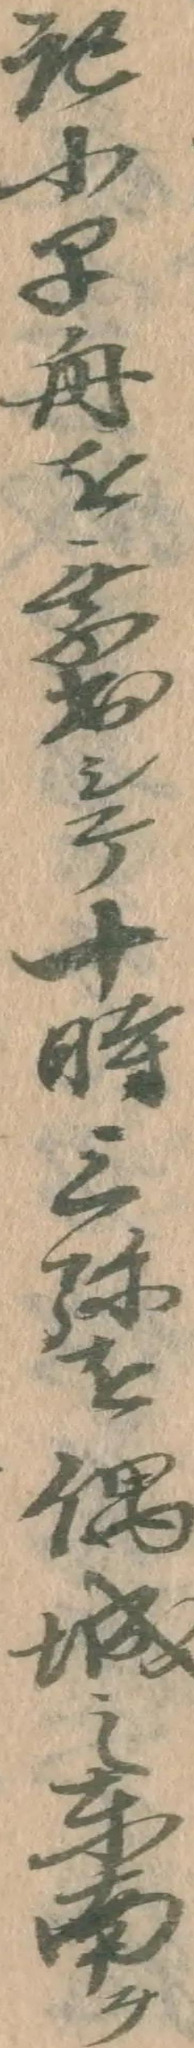記小早舟を乗出して十時三弥を偶城之東南を
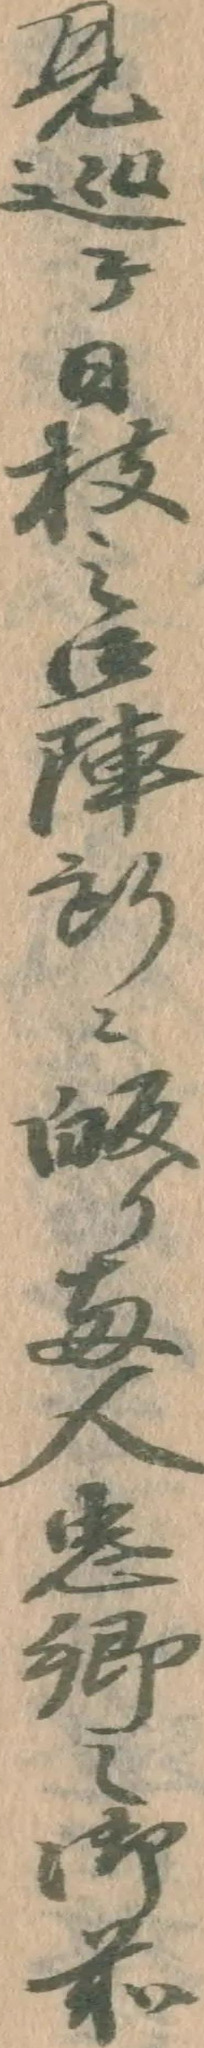見巡て日枝之御陣所に皈り両人忠郷之御前
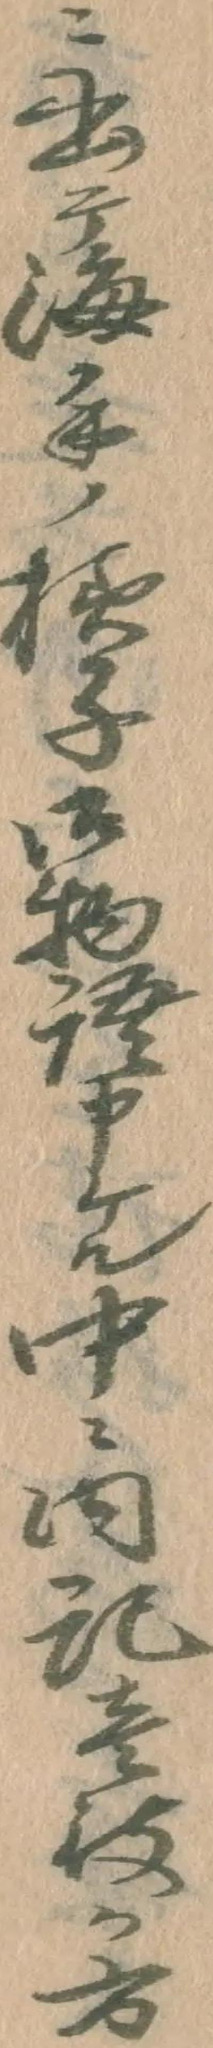に出て海手之様子御物語申ける中に内記壱岐か方
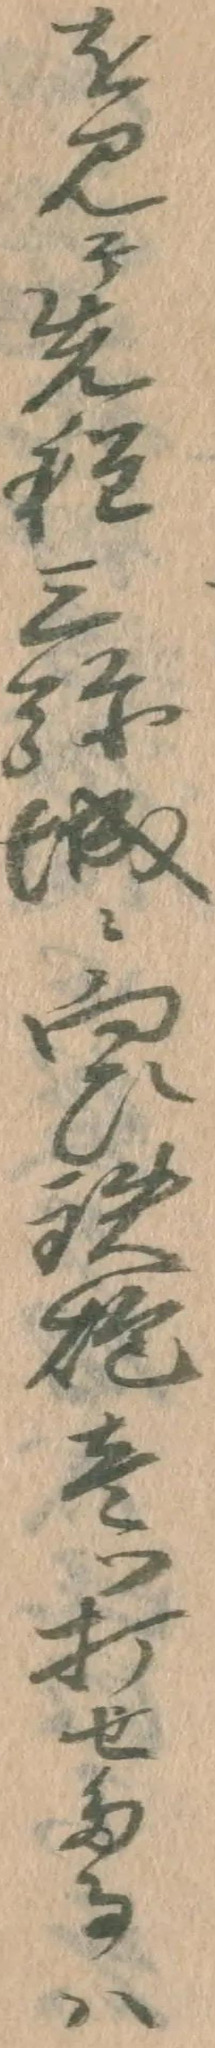を見て先程三弥城に向ひ鉄炮壱つ打せ多るは
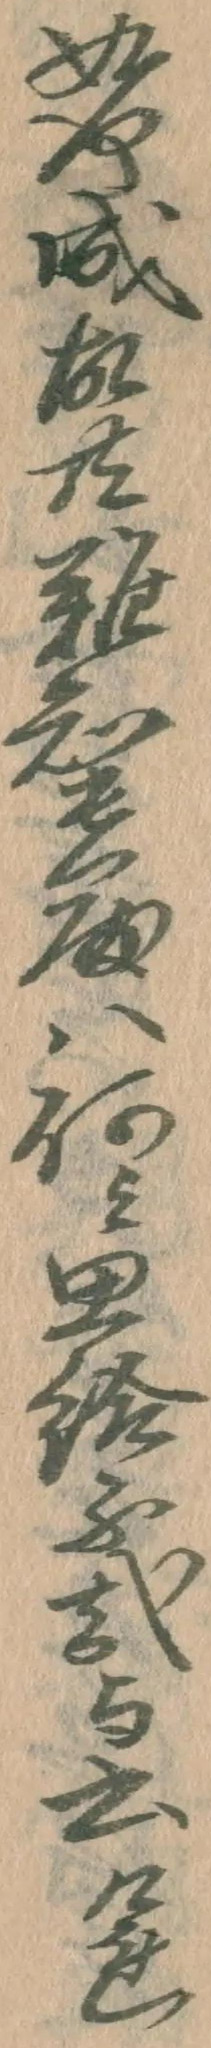如何成故共難知貴殿は何与思給ふ哉与云け連
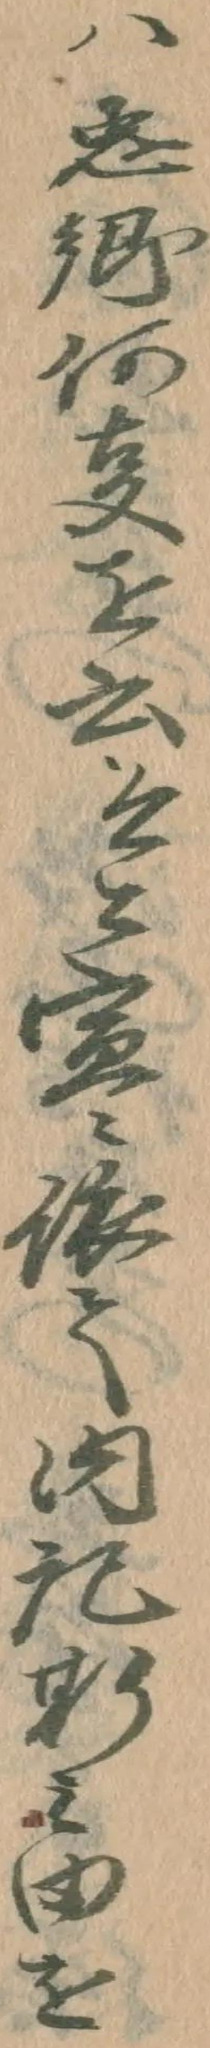は忠郷何事を云そと宣に依て内記斯之由を
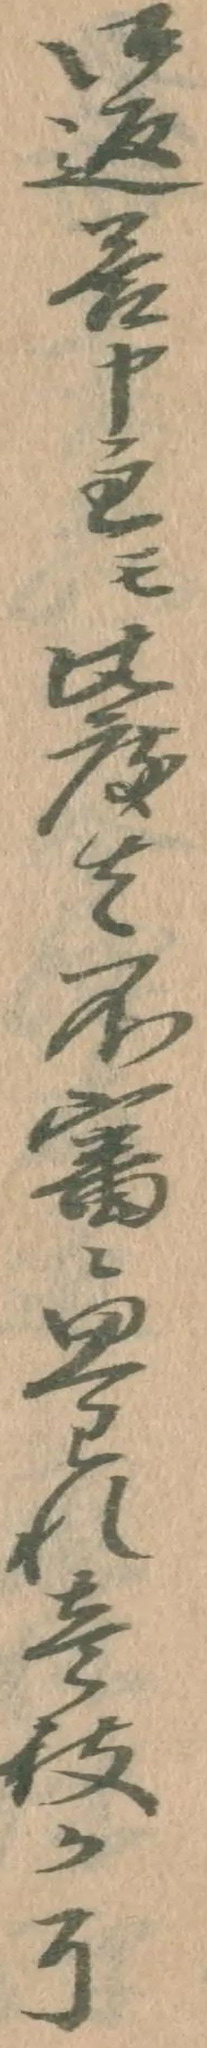御返答申主も此度者不審に思已れ壱岐か了
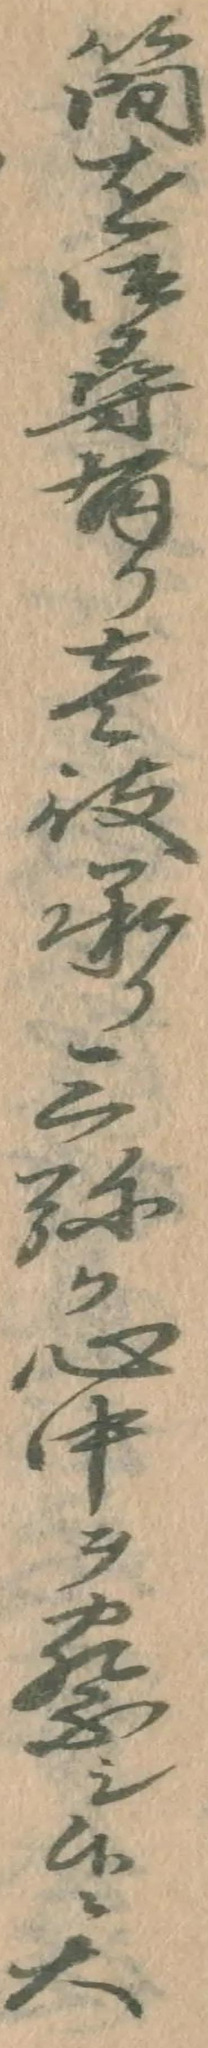簡を御尋有り壱岐承り三弥か心中を察し候に大
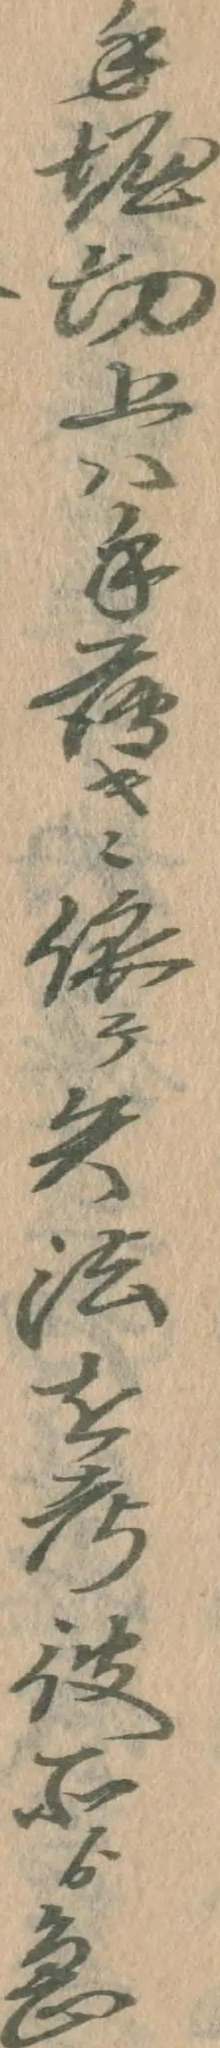手堀切上は手薄きに依て矢法を考彼所ゟ急
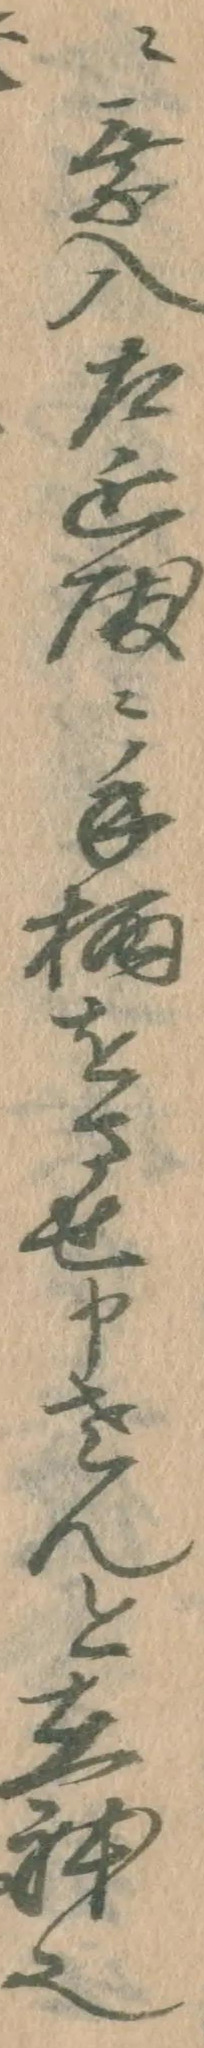に乗入左近殿に手柄をさせ申さんと在躰也
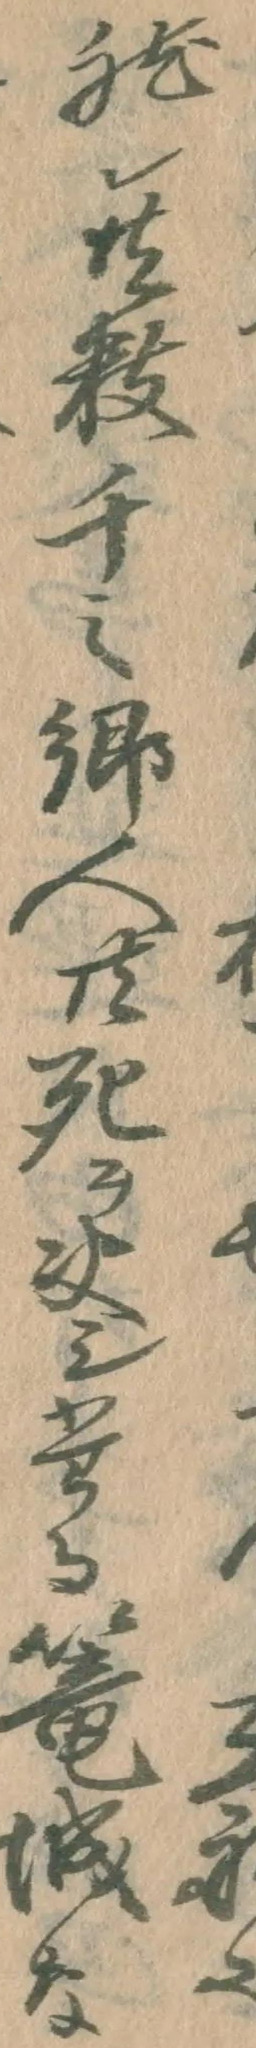然れ共数千之郷人とも死を決し堂るに篭城な
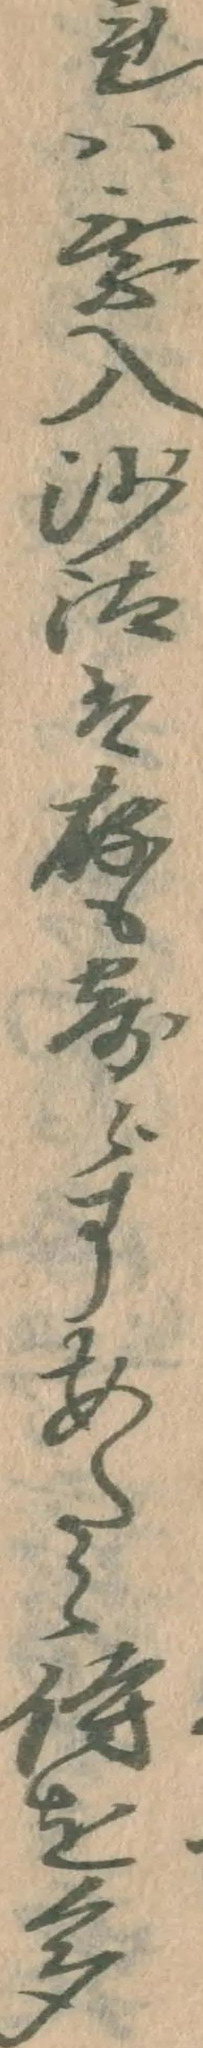連は乗入沙汰盤存も寄らすあたら侍を多
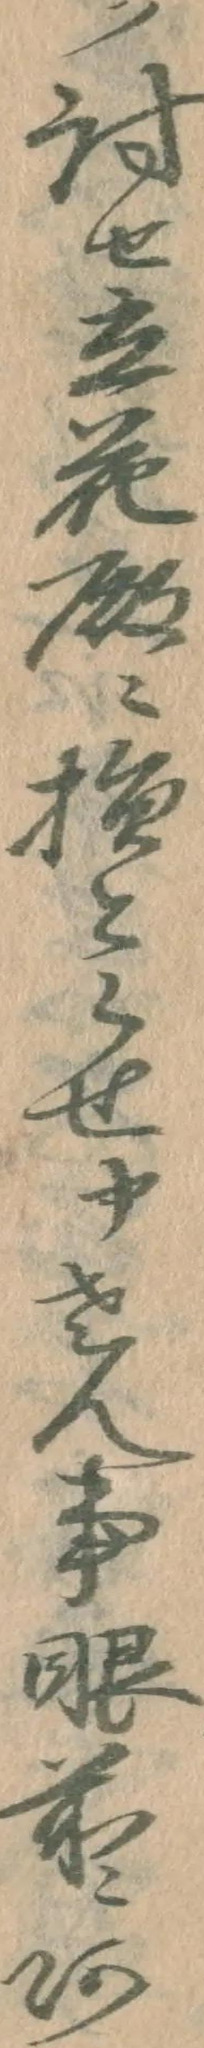く討せ立花殿に損とらせ申さん事眼前に阿
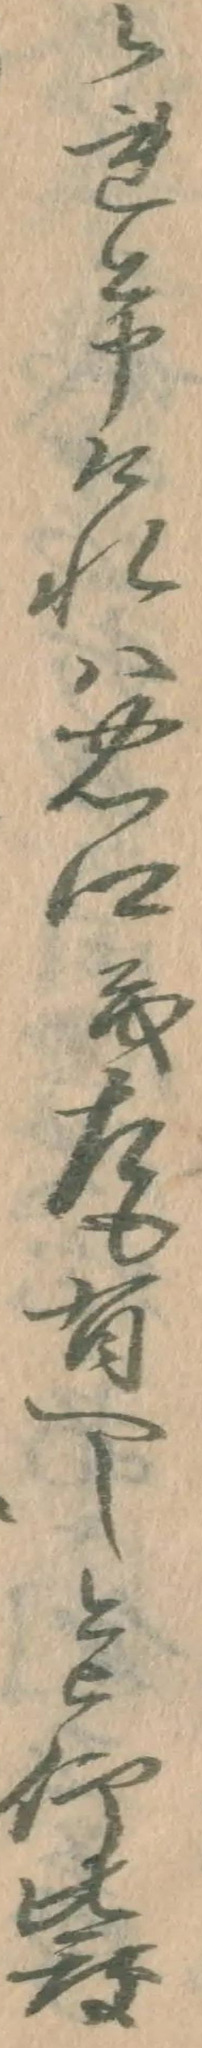ら連と申けれは忠郷茂左も有へしと被仰此度

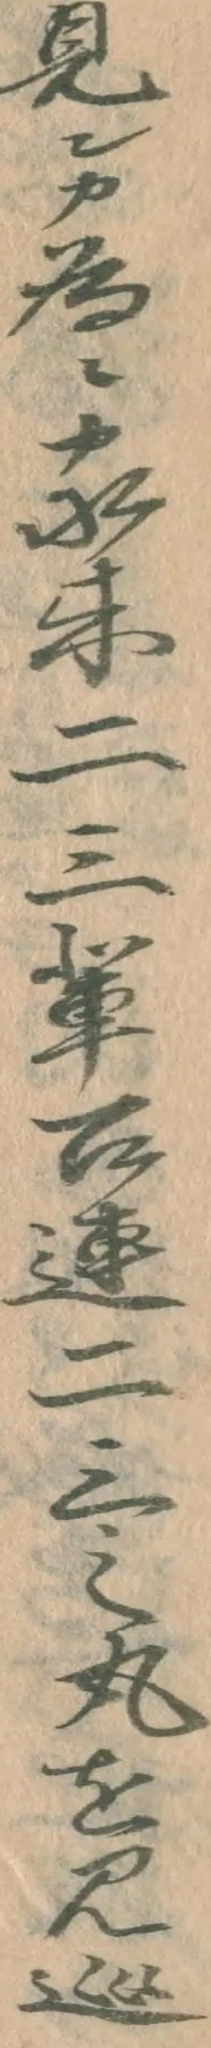見しか為に家来二三輩召連二三之丸を見巡
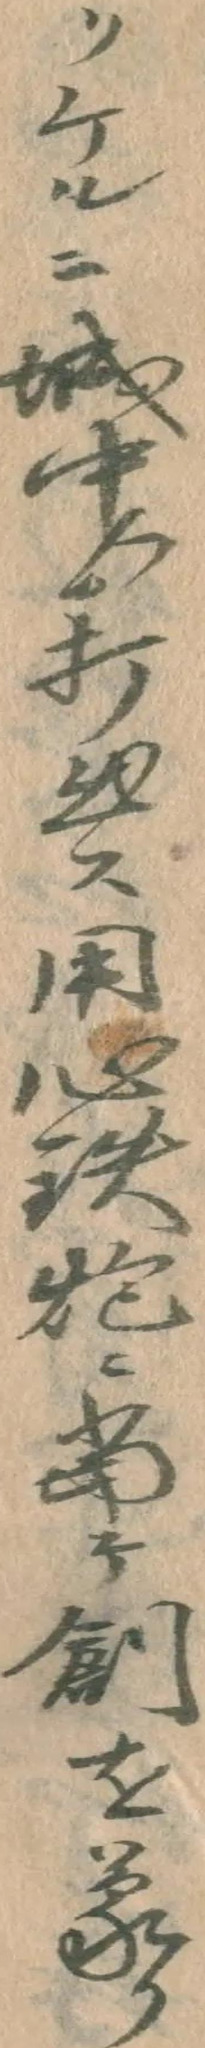りけるに城中ゟ打出す用心鉄炮に当て創を蒙り
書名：切支丹御退治記 49巻. [4]
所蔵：国立国会図書館 National Diet Library, JAPAN
